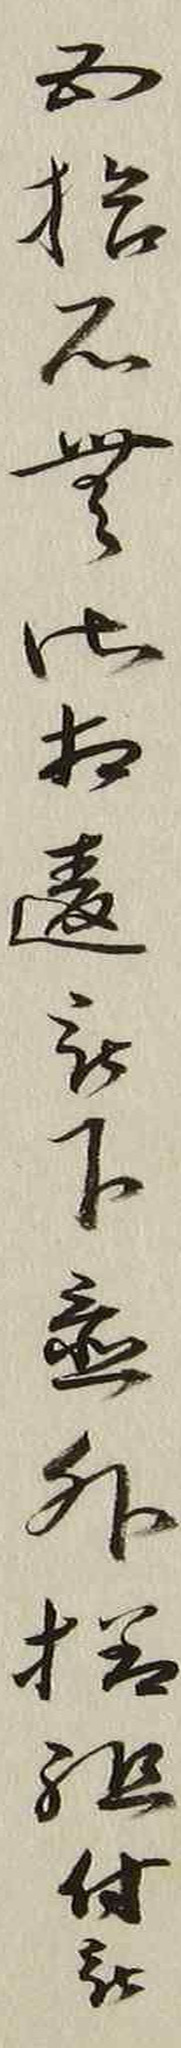五拾石無御相違被下置外様組付被
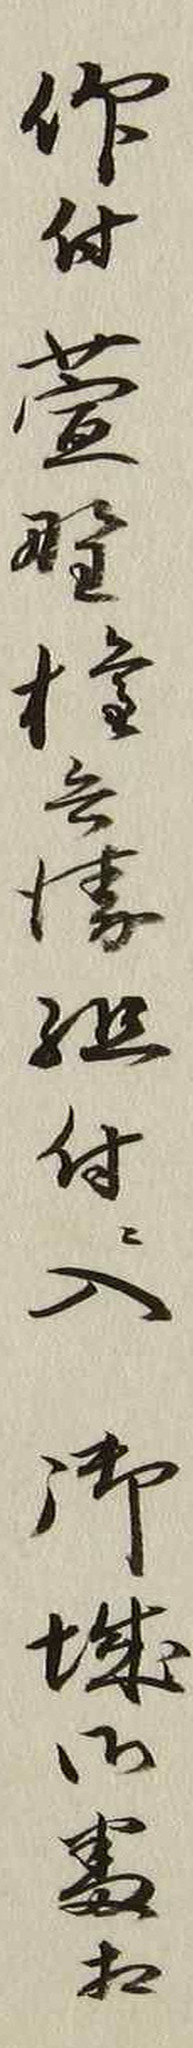仰付萱野権兵衛組付ニ入御城御番相
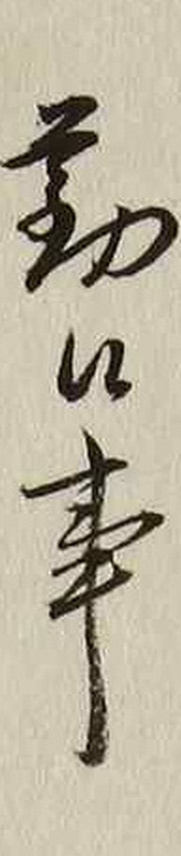勤候事
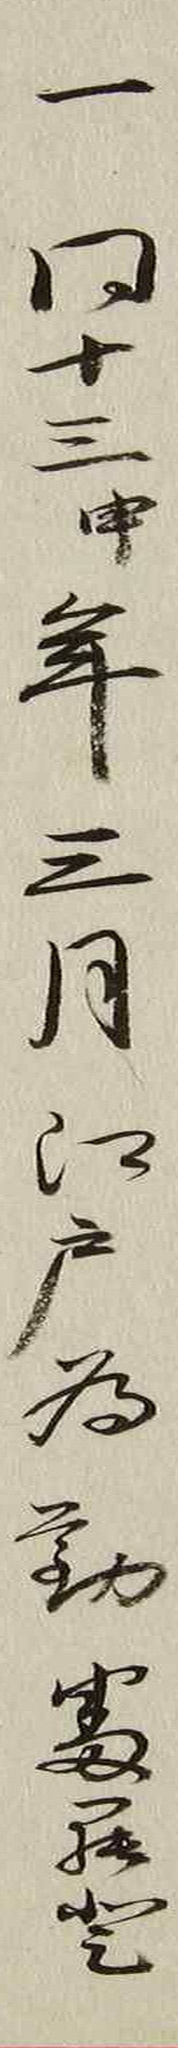一同十三申年三月江戸為勤番罷登
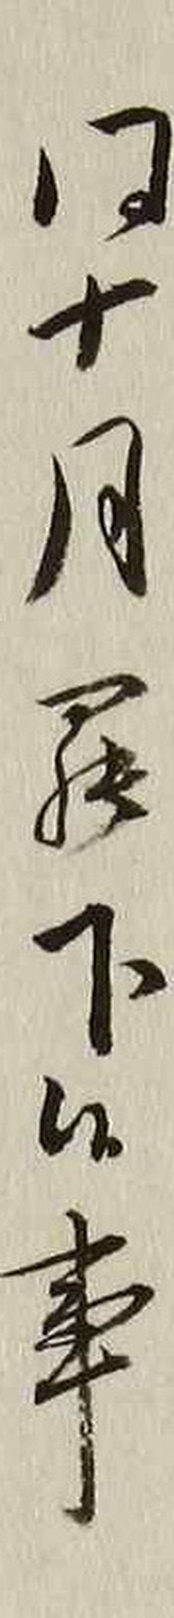同十月罷下候事
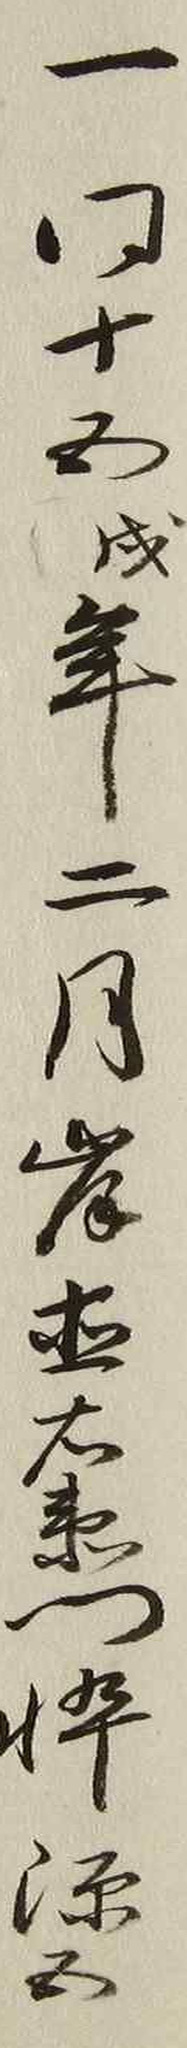一同十五戌年二月岸直右衛門忰源五
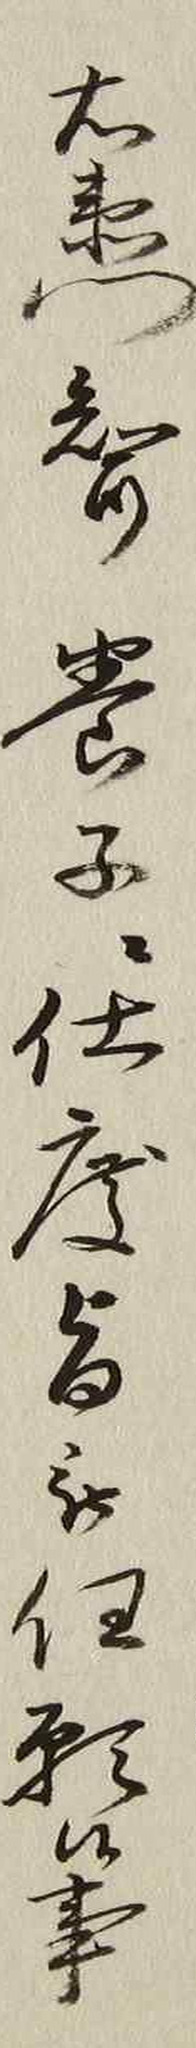右衛門婿養子ニ仕度旨被任願候事
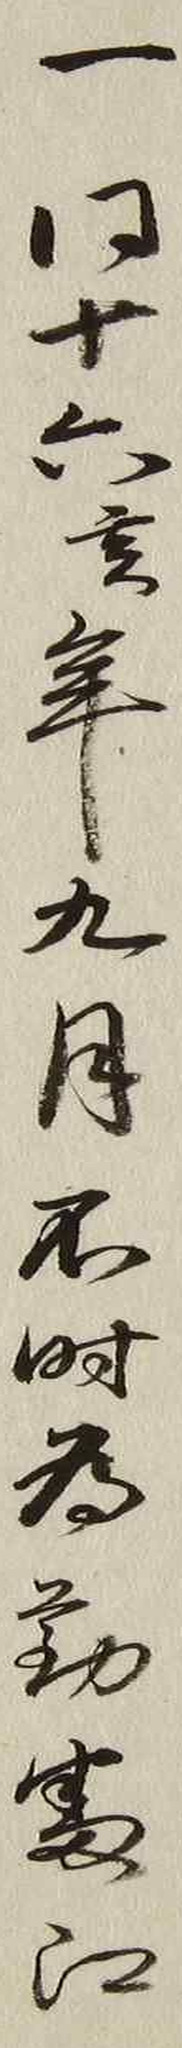一同十六亥年九月不時為勤番江
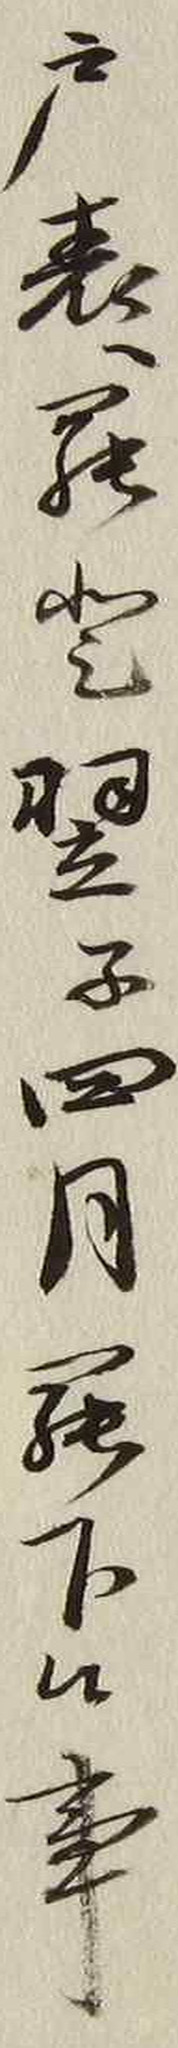戸表へ罷登翌子年四月罷下候事
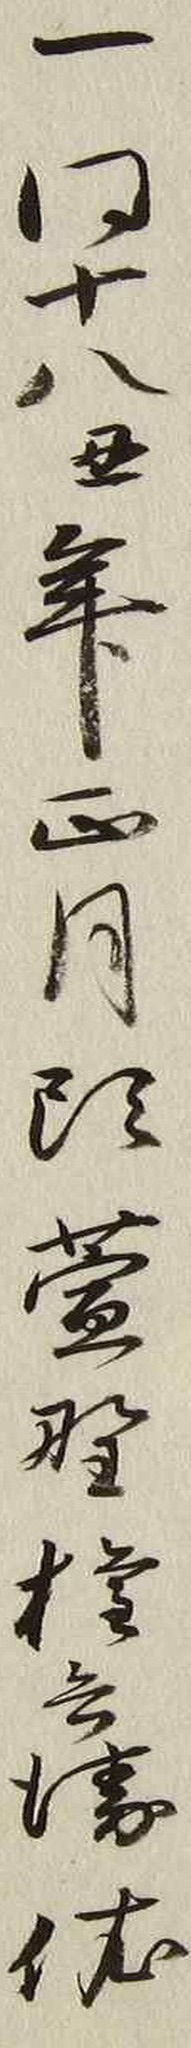一同十八丑年正月頭萱野権兵衛依
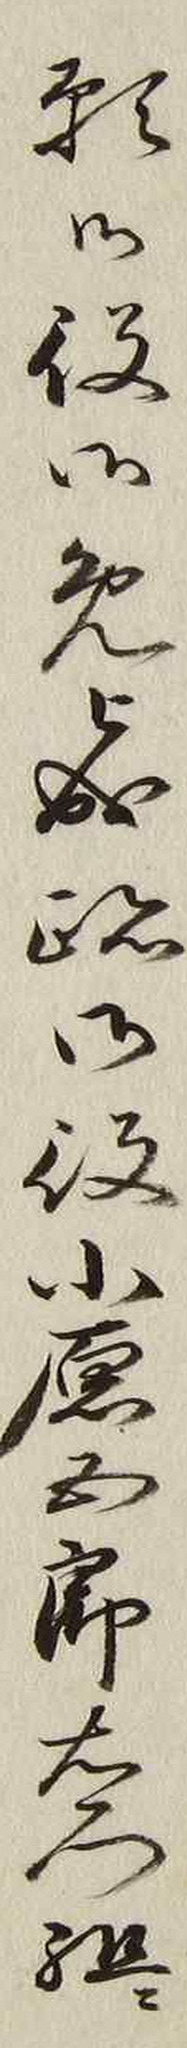願御役御免被成跡御役小原五郎右衛門組ニ
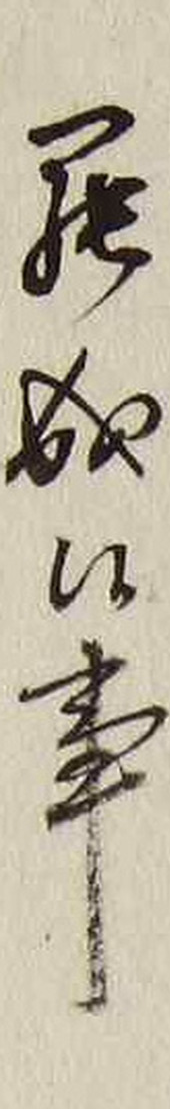罷成候事
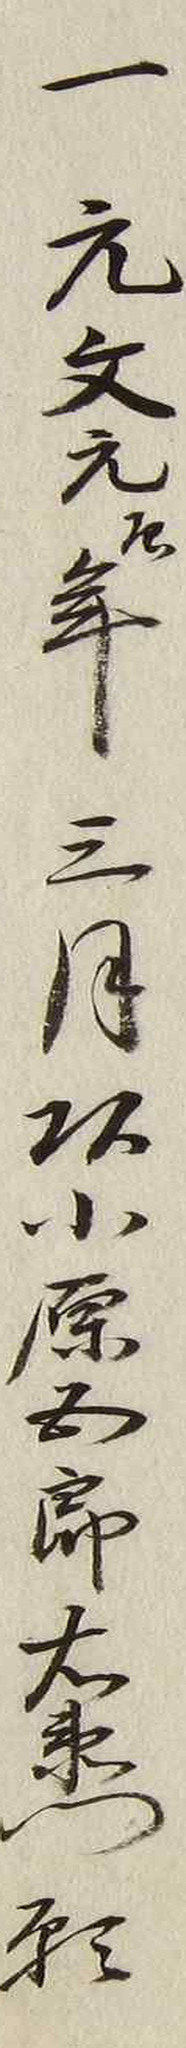一元文元辰年三月頭小原五郎右衛門願
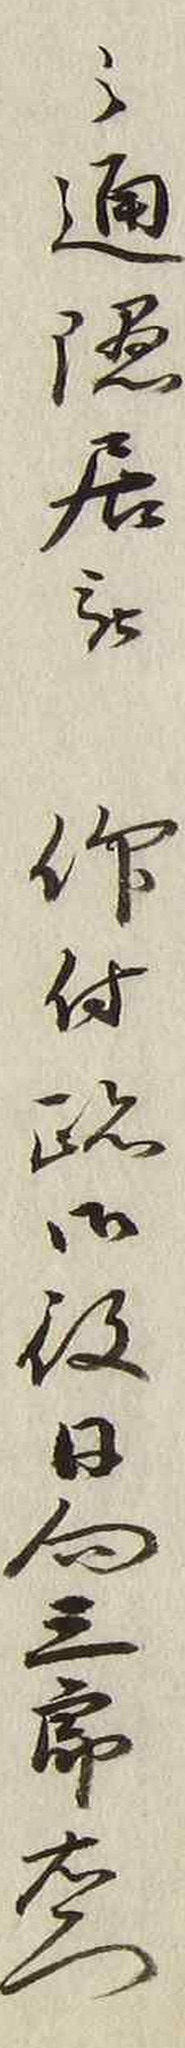之通隠居被仰付跡御役日向三郎右衛門
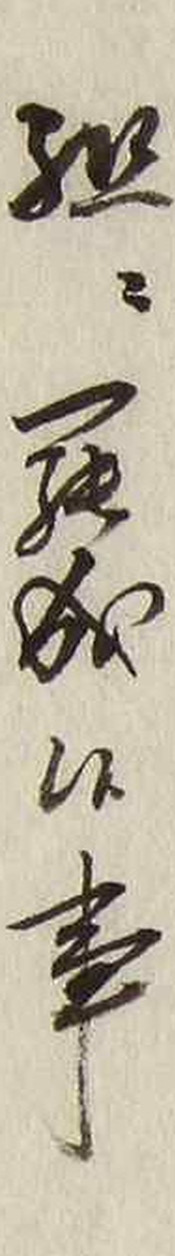組ニ罷成候事

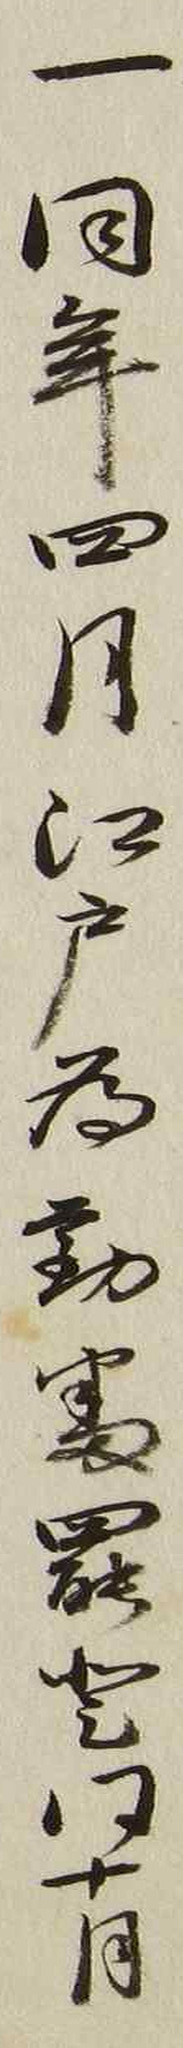一同年四月江戸為勤番罷登同十月
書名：諸士系譜　巻之160　な之部2
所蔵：会津若松市立会津図書館
